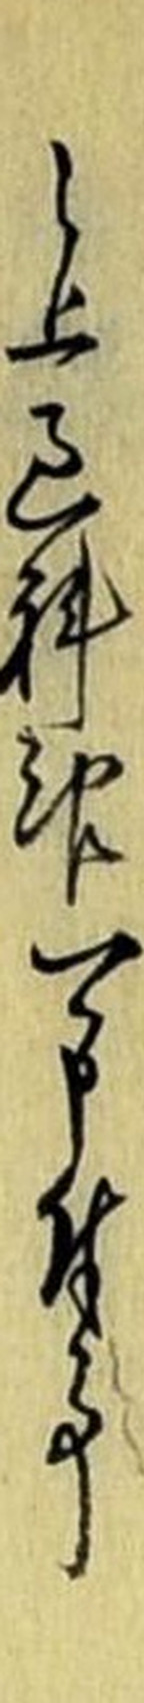之上過料銀可申付事
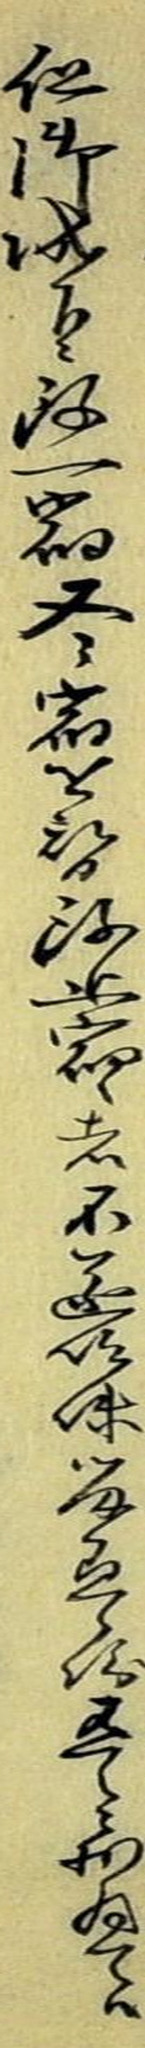但御城下ニ致一宿又々宿を替致止宿候者不遂吟味留置候儀有之ニおゐてハ
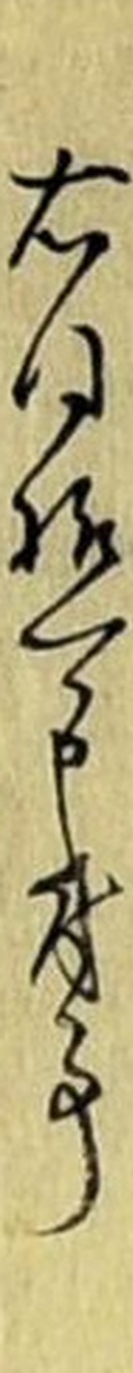右同様可申付事
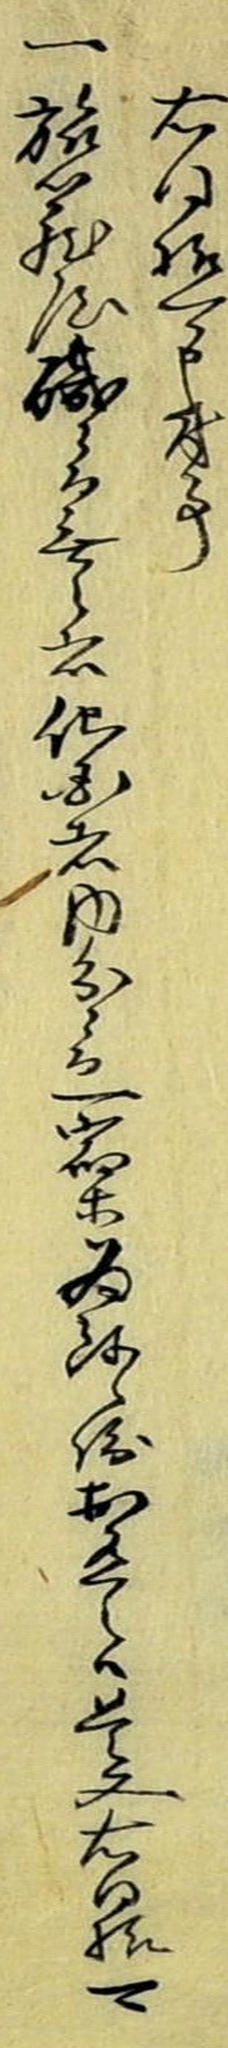一旅籠屋職ニ而無之者他国者内分ニ而一宿等為致候儀於有之ハ是又右同様可
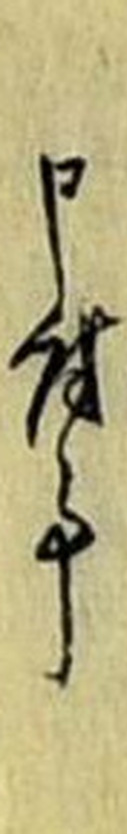申付事
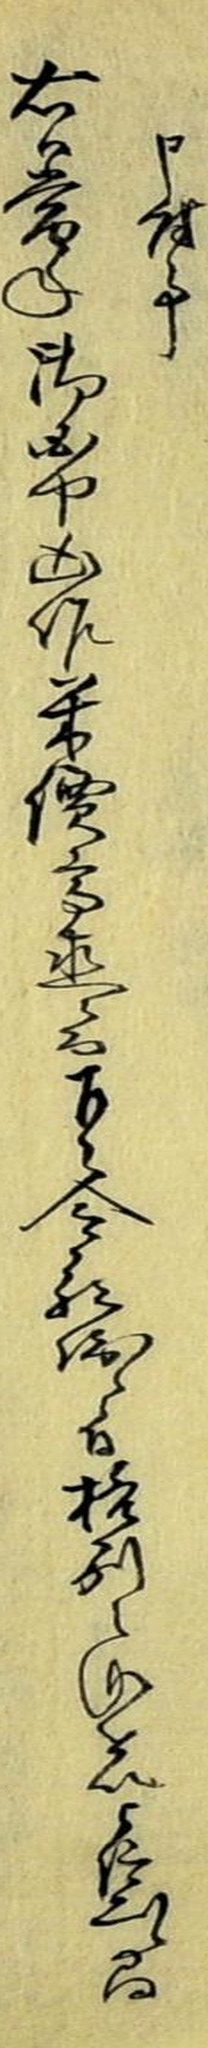右ハ当年御国中凶作米価高直ニ而下々令難儀候ニ付格別之趣を以被仰出候間
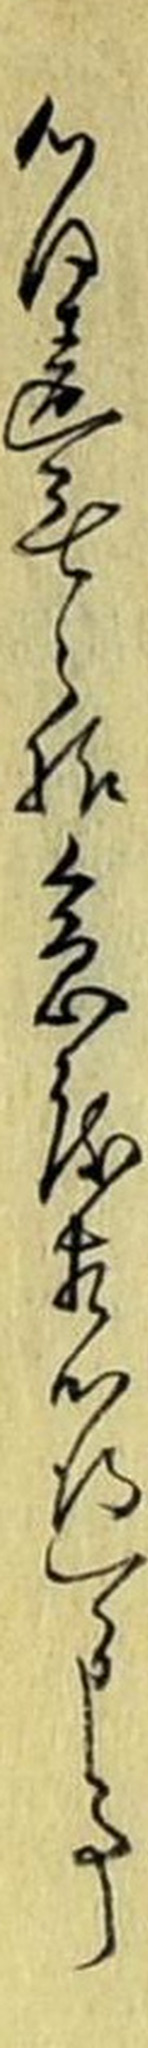心得違無之様急度致相心得可申事
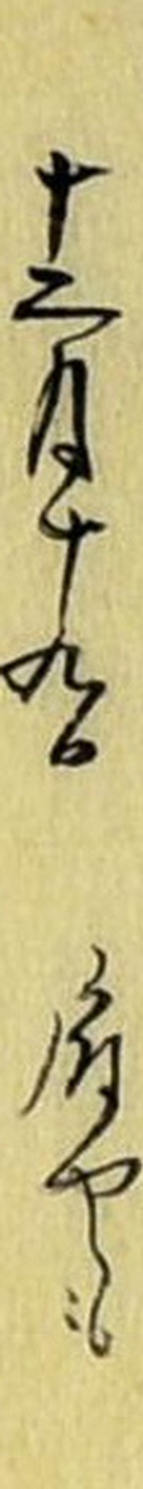十二月十九日府中へも
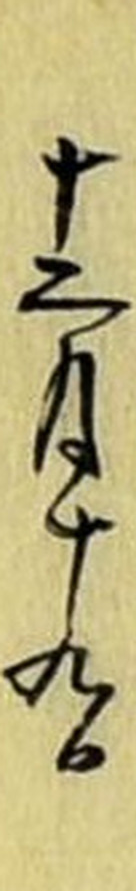十月廿九日

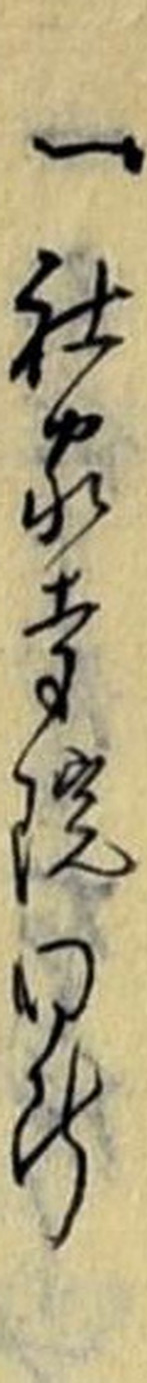一社家寺院同断
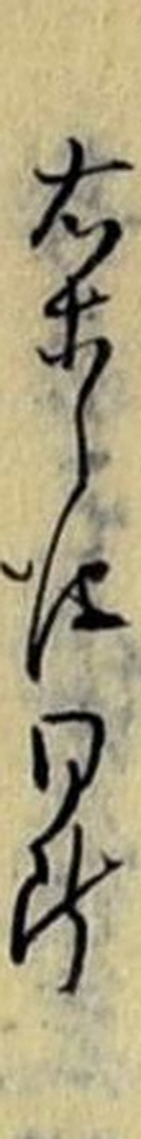右等之儀同断
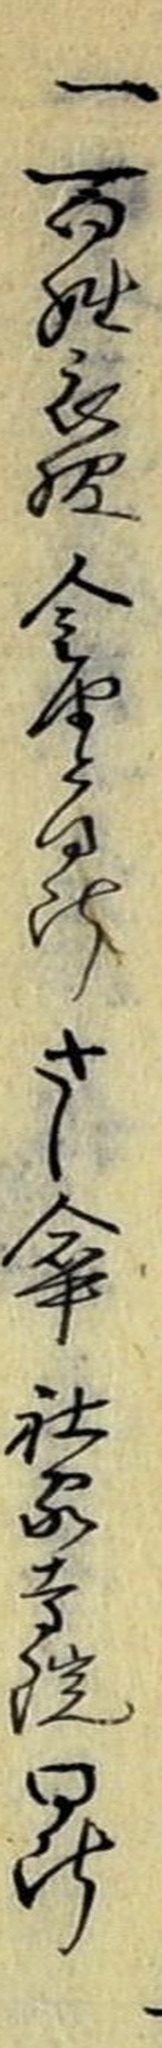一百姓衣服金津と同断さし傘社家寺院同断
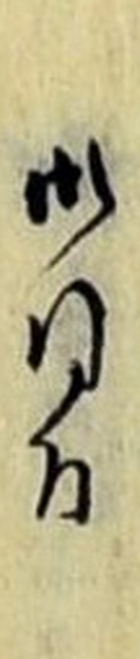御目付
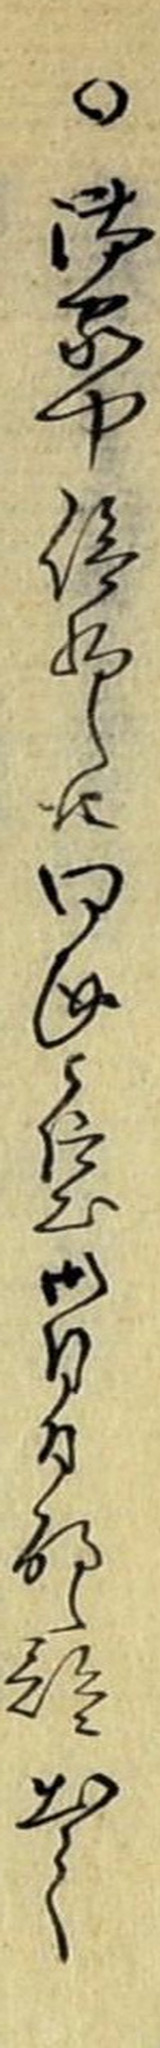○御家中倹約之儀同趣被仰出御目付触候郡ニ出之
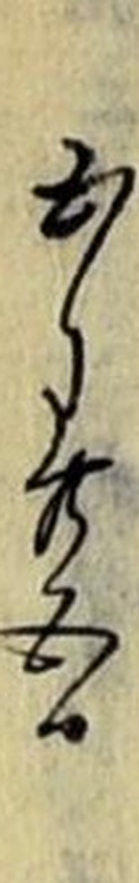五月廿五日
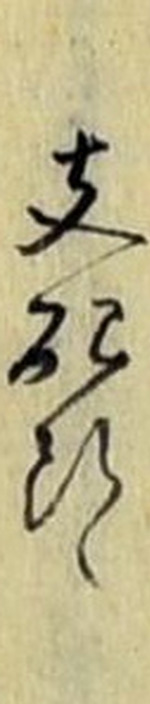支配頭へ
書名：命令之部 五
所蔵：福井県文書館 Fukui Prefectural Archives
